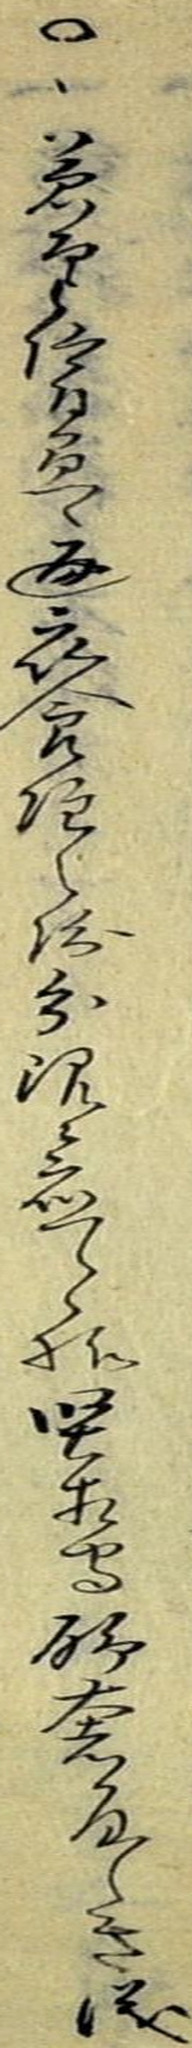○兼而被仰付置候通衣食住之儀分限に応し候様堅相守聊奢ましき儀
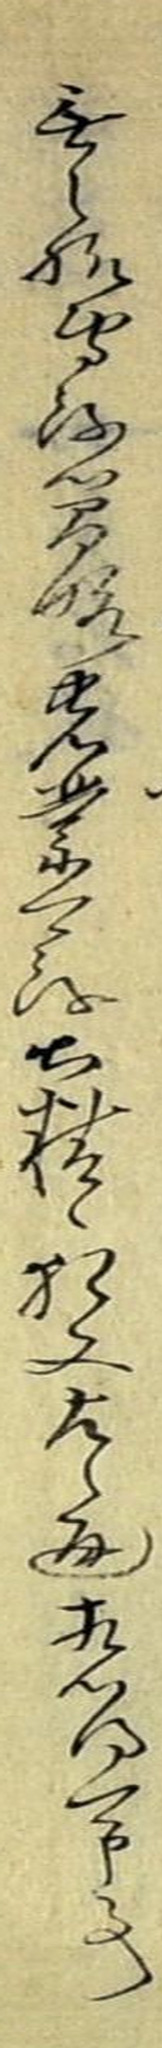無之様専致簡略農業可致出精候猶又左之通相心得可申事
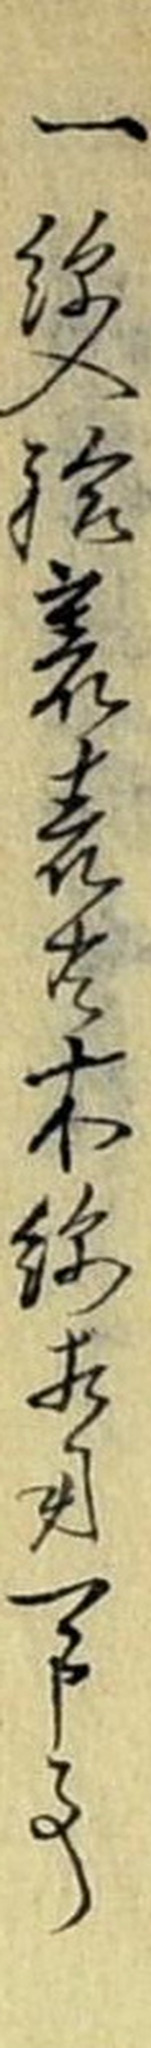一綿入袷裏表共木綿相用可申事
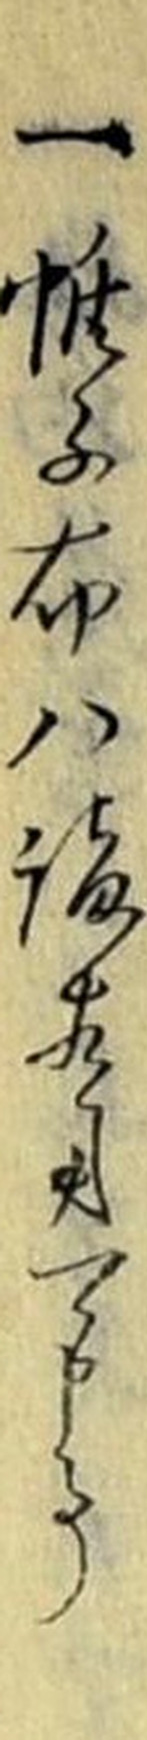一帷子布八講相用可申事
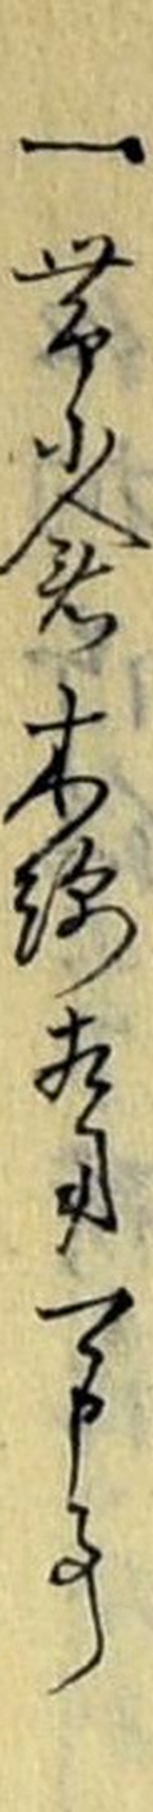一帯小倉木綿相用可申事
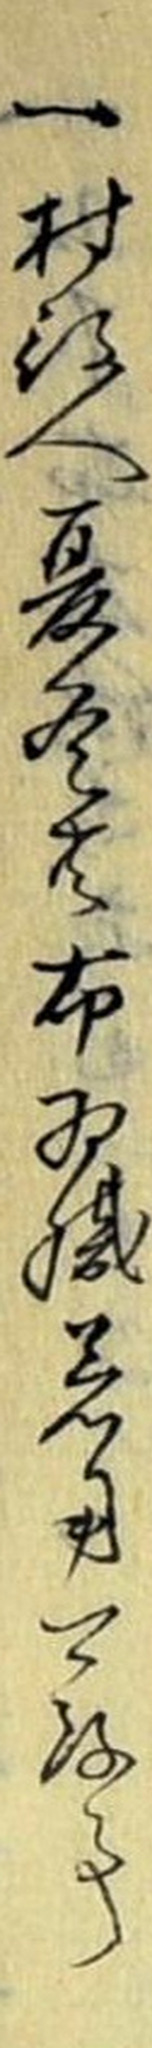一村役人夏冬共布羽織着用可致事
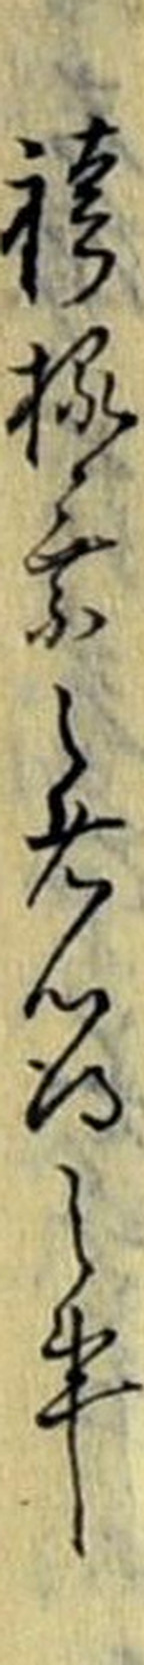袴椽乗之者心得之事

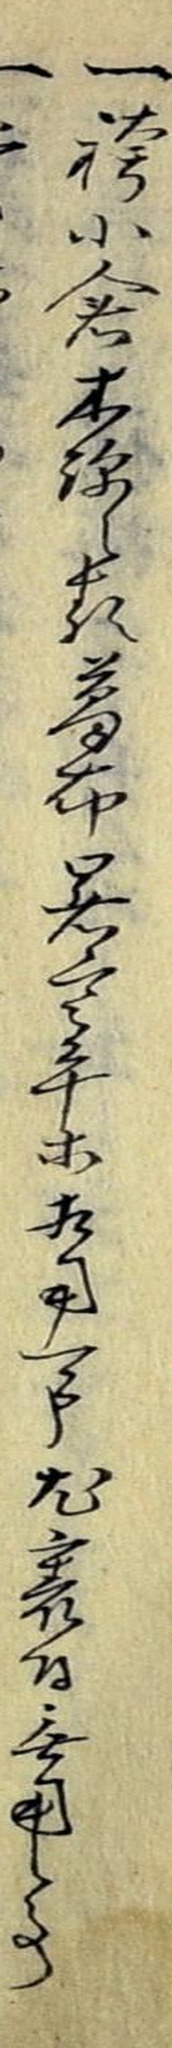一袴小倉木綿之類葛布暑寒午等相用可申尤裏付無用事
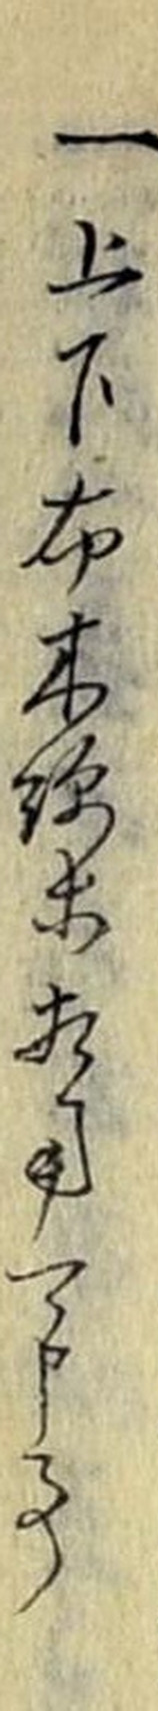一上下布木綿等相用可申事
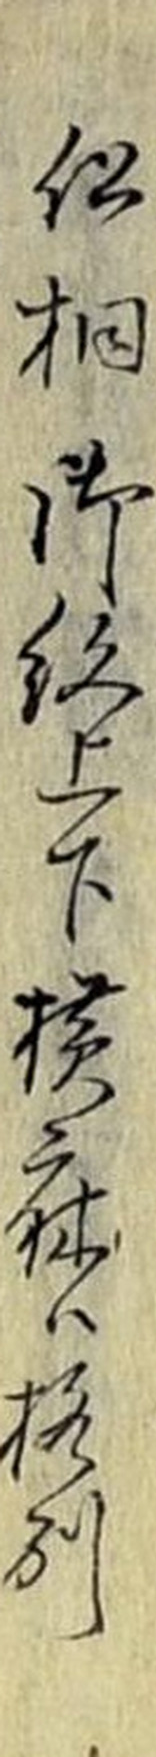但桐御紋上下横麻は格別
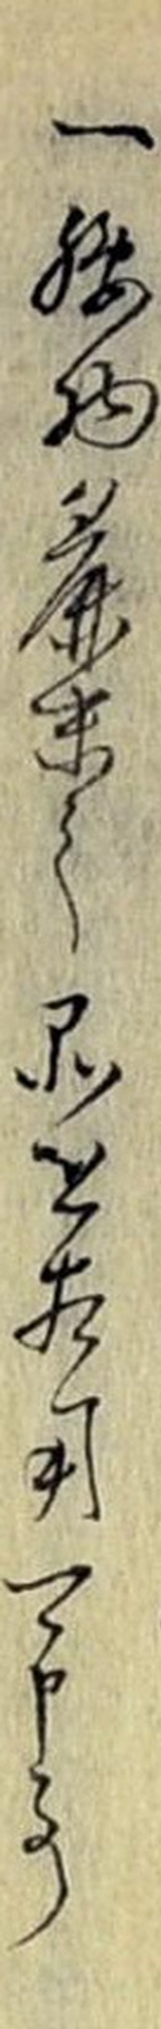一腰物麁末之品を相用可申事
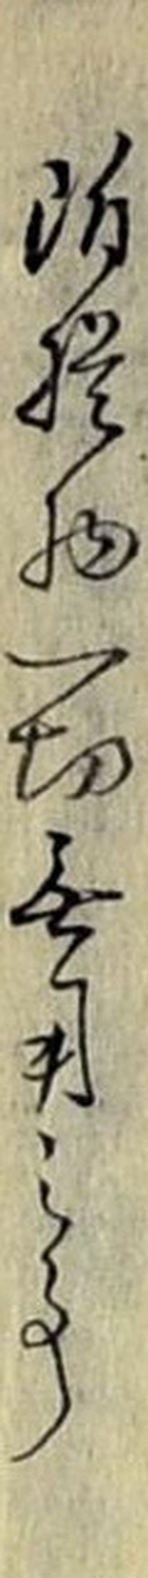附提物一切無用之事
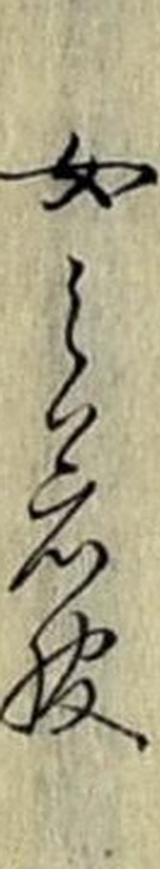女之着服
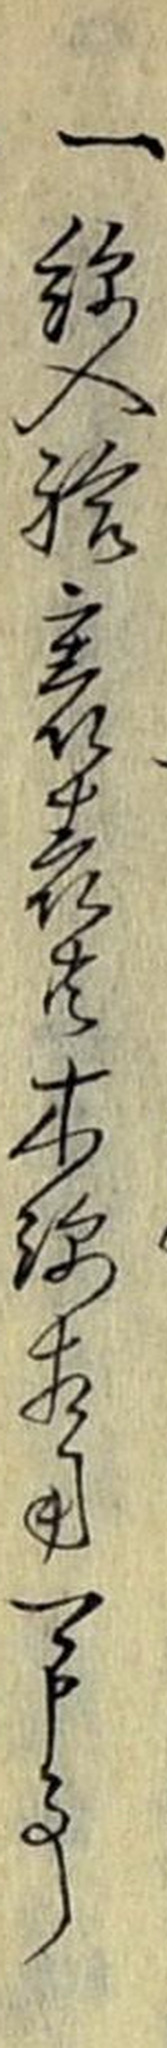一綿入袷裏表共木綿相用可申事
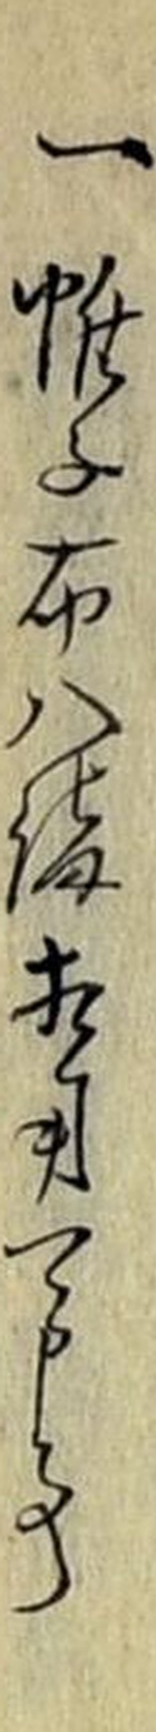一帷子布八講相用可申事
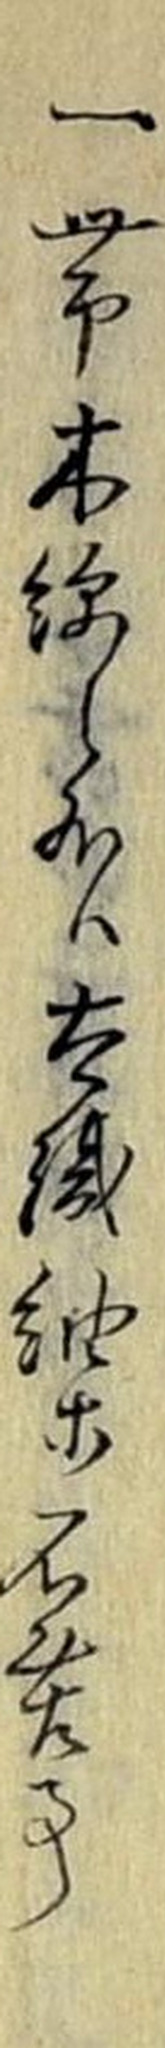一帯木綿之外は太織紬等不苦事
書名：命令之部 六
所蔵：福井県文書館 Fukui Prefectural Archives
